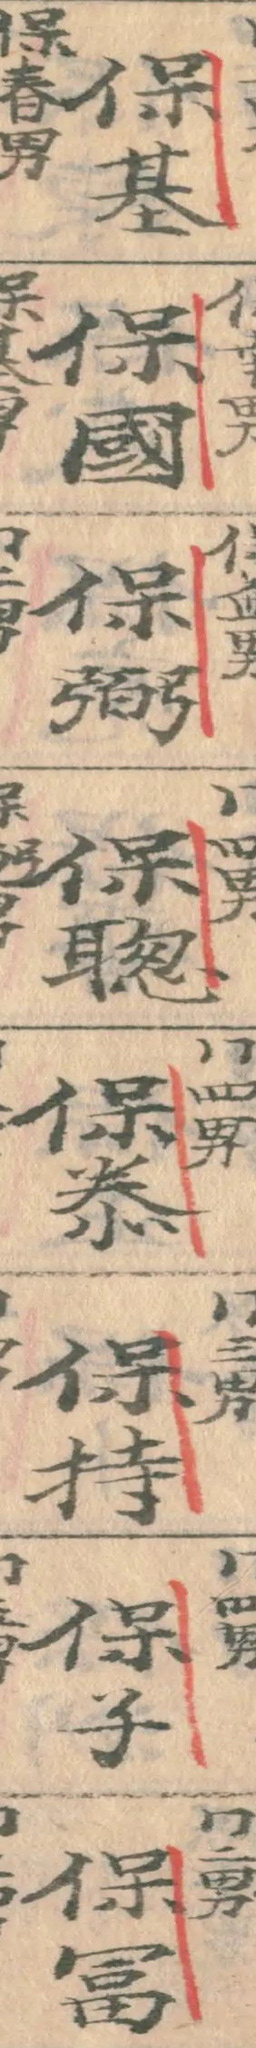保基保国保弼保聡保恭保持保子保冨
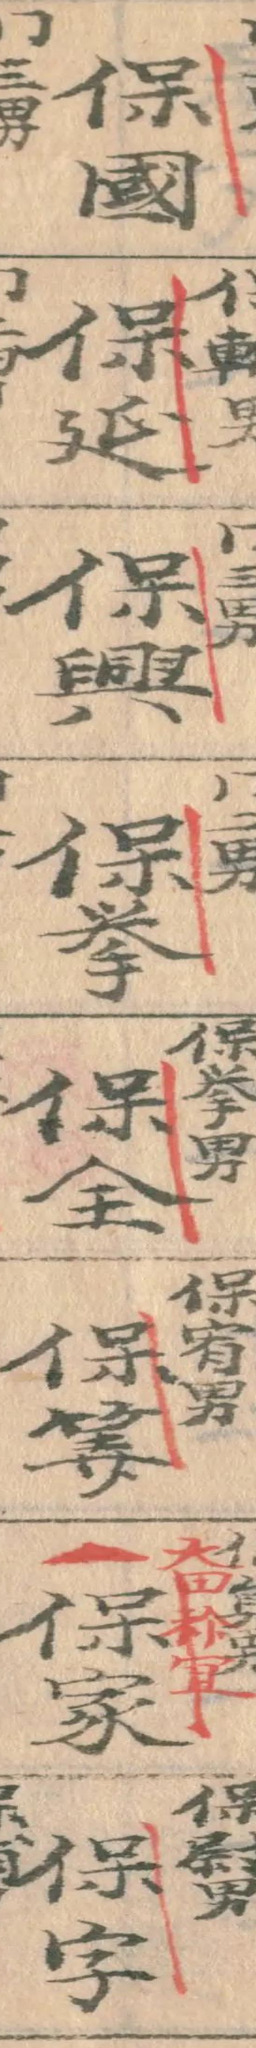保国保延保興保挙保全保等▲保家保字
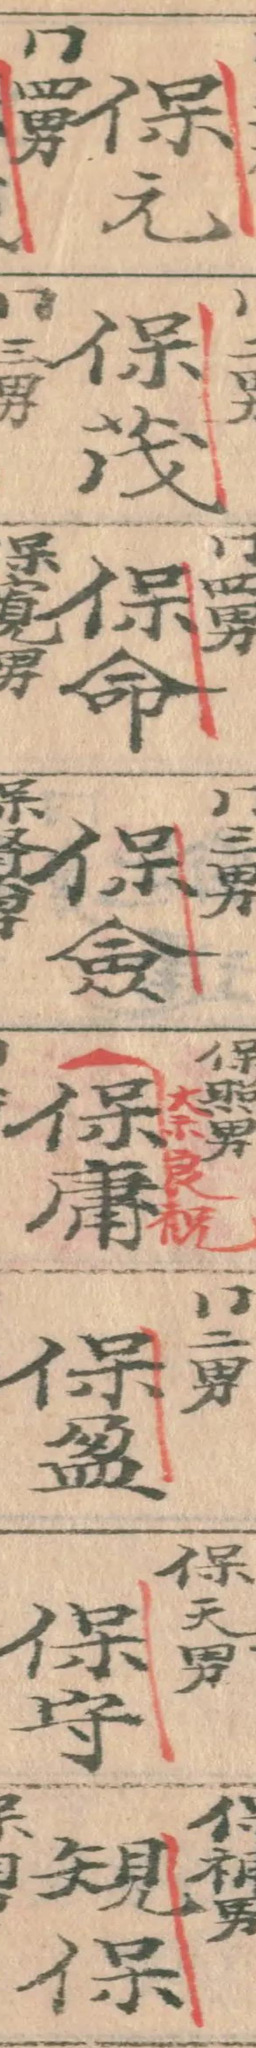保元保茂保命保僉▲保庸保盈保守規保
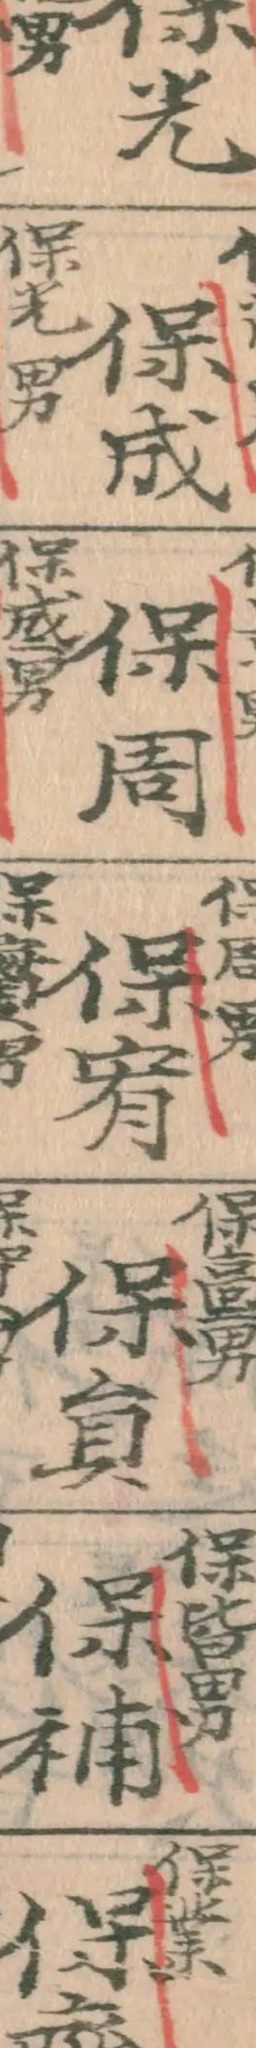保氏保光保成保周保宥保員保補保齊
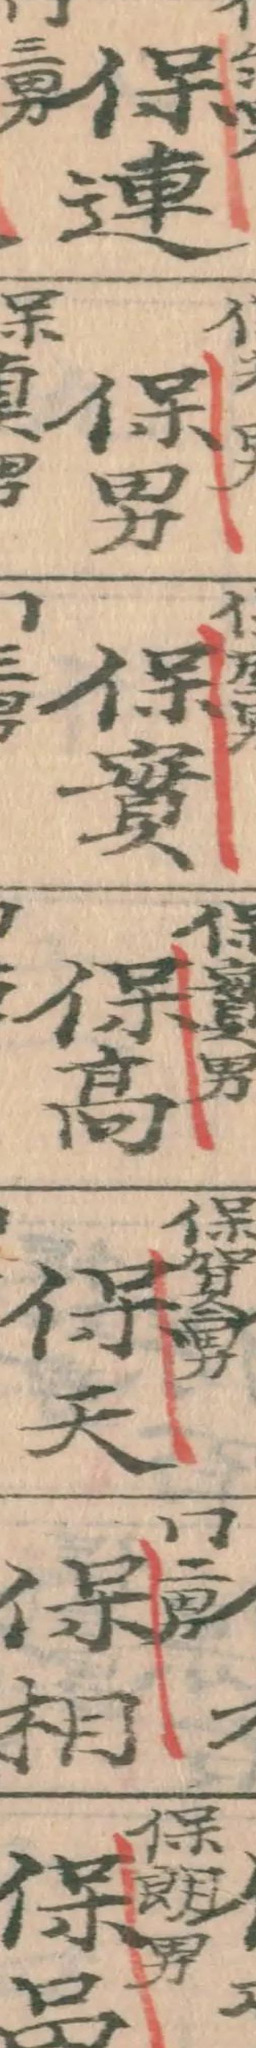保連保男保実保髙保天保相保品
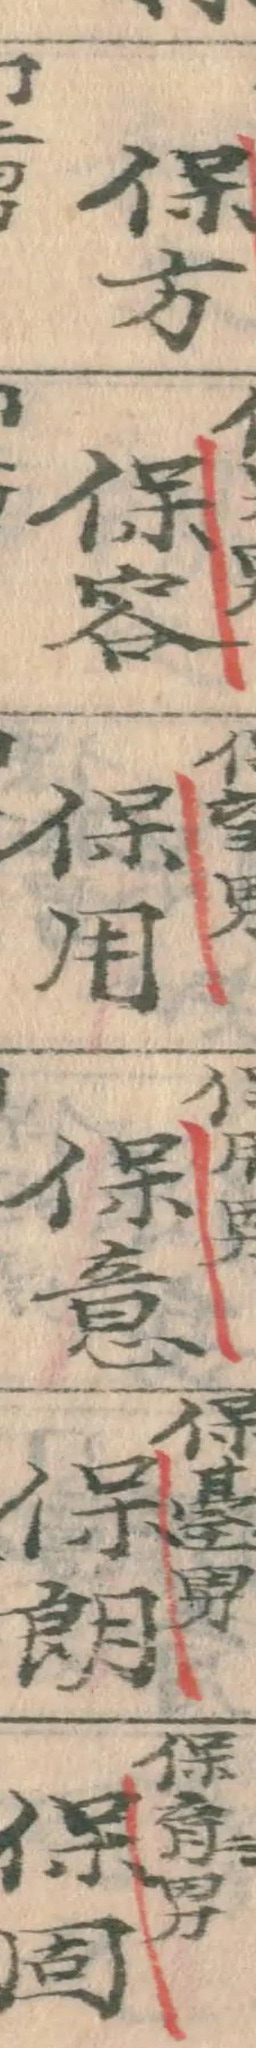保森保方保容保用保意保朗保固
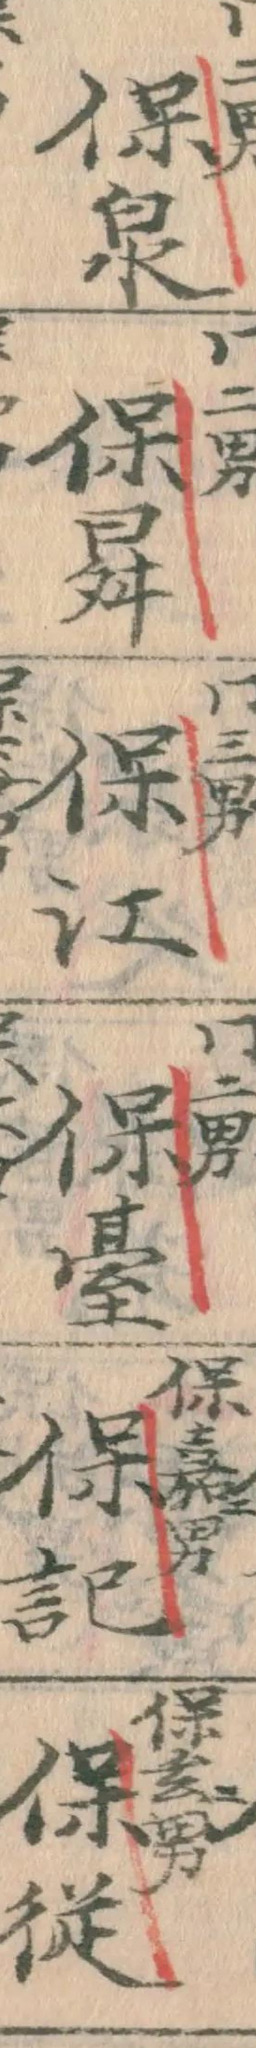保泉保曻保江保台保記保従
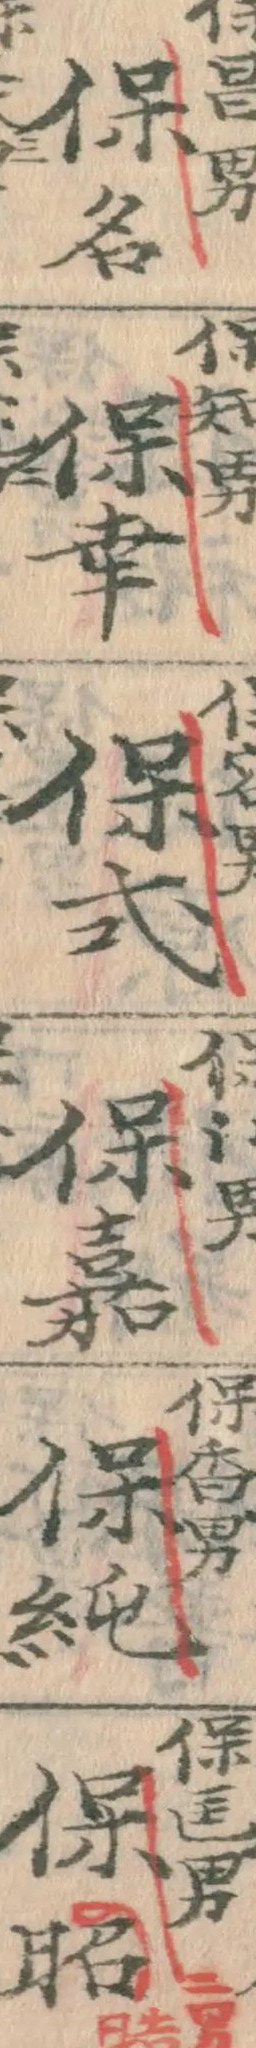保名保幸保式保嘉保純保￮昭
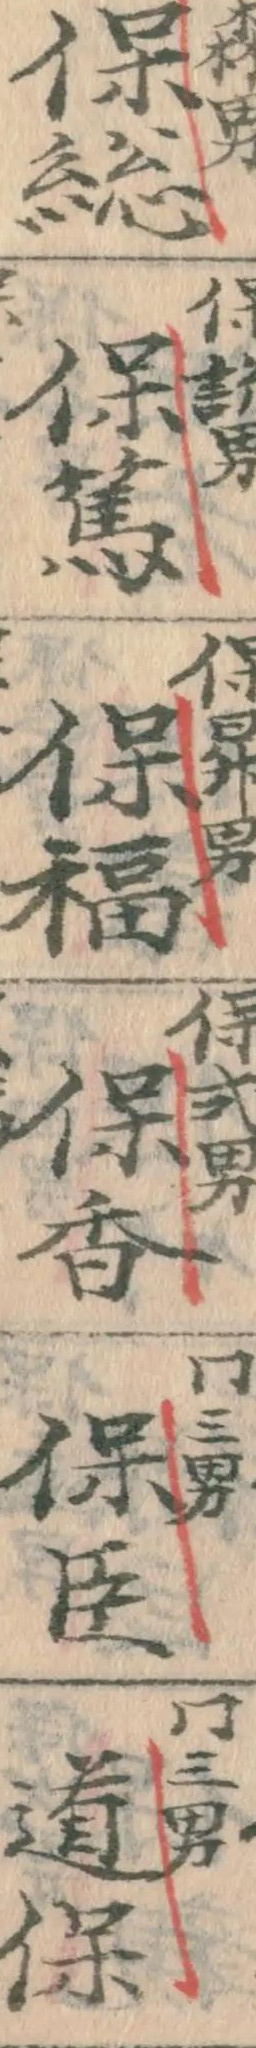保総保篤保福保香保臣道保
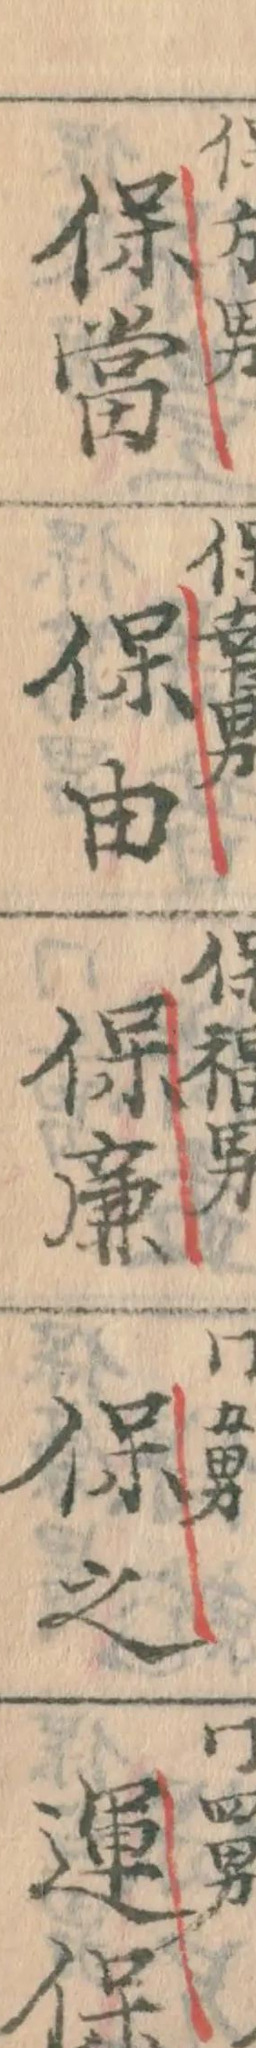保当保由保廉保之運保

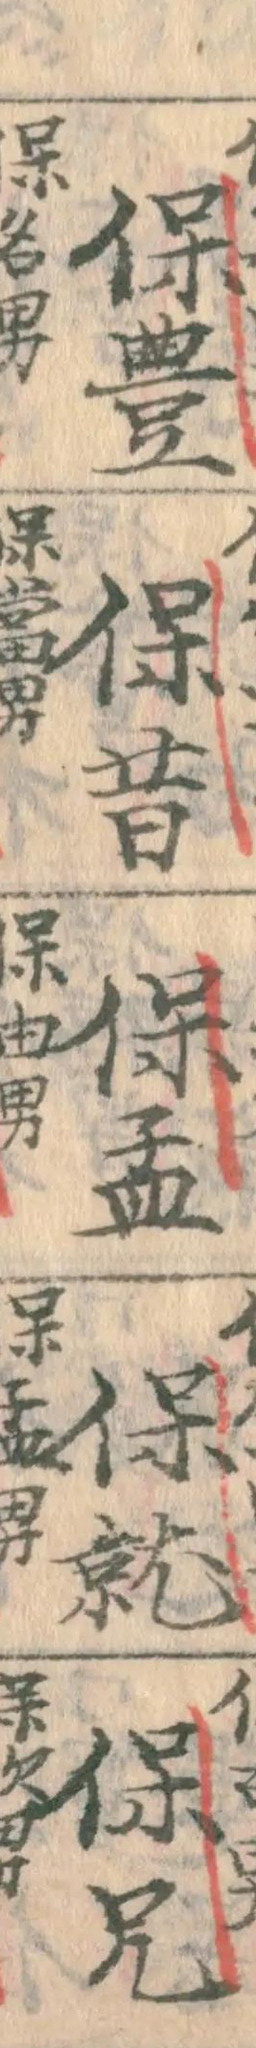保豊保昔保孟保就保兄
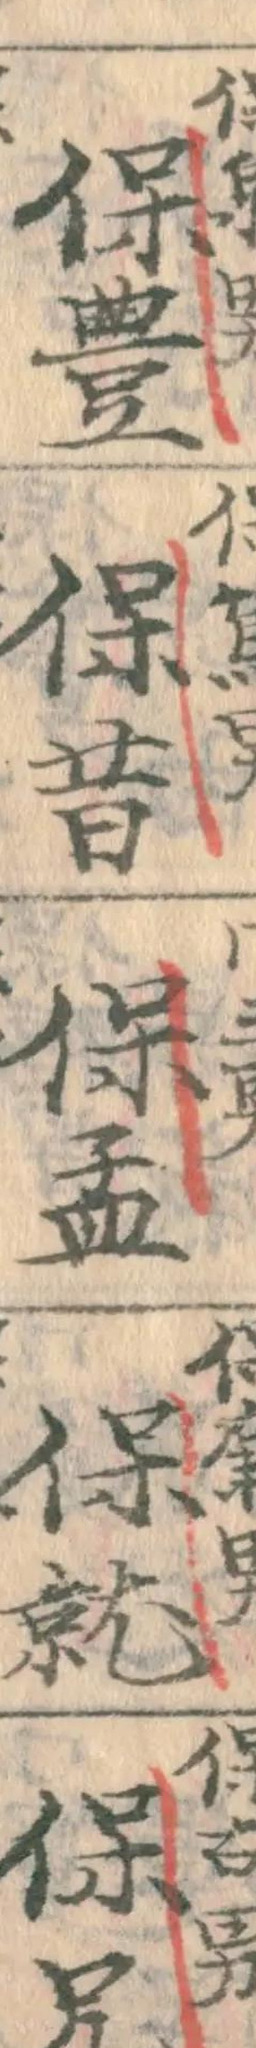保豊保昔保孟保就保兄
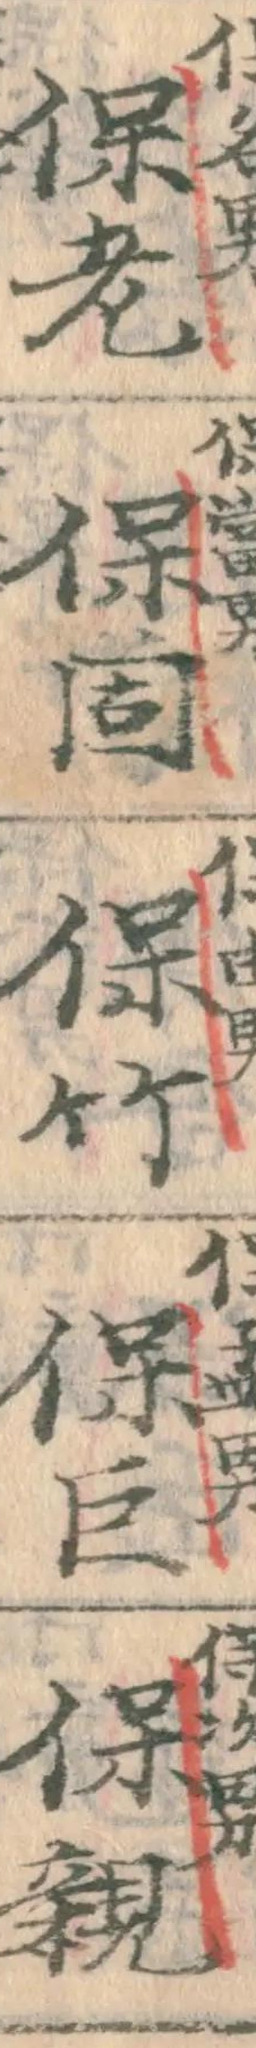保老保固保竹保巨保親
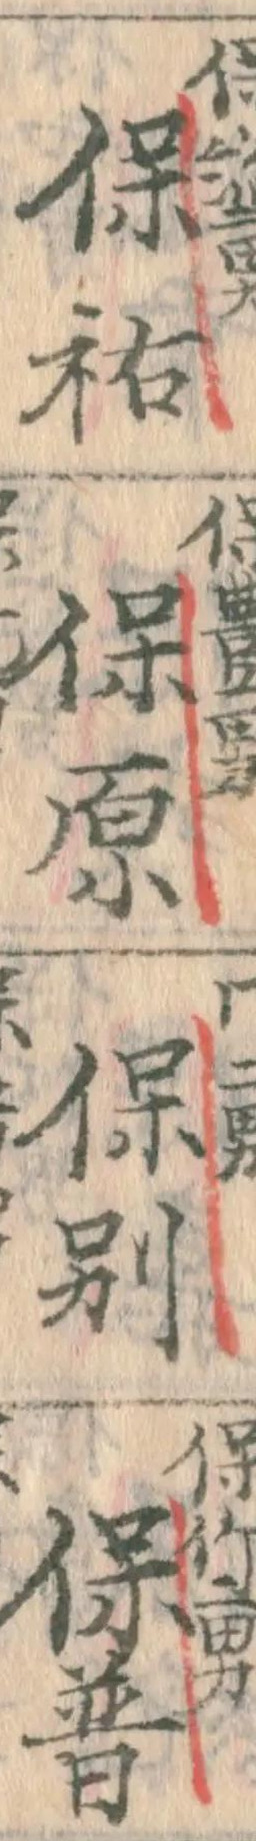保祐保原保別保普
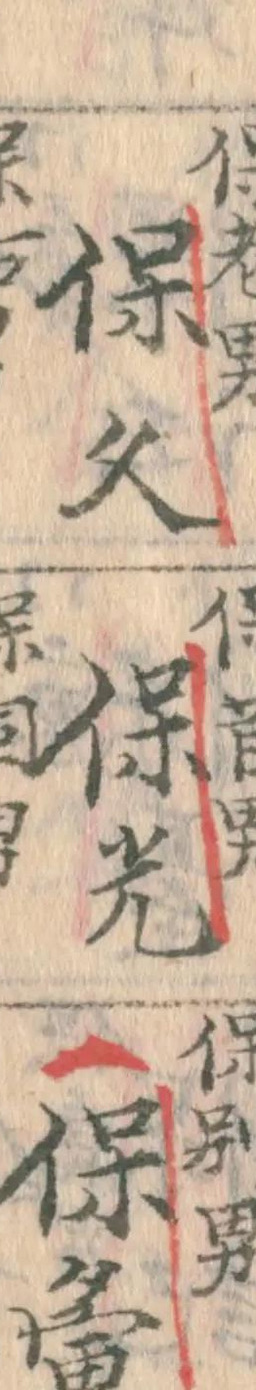保久保光▲保夤
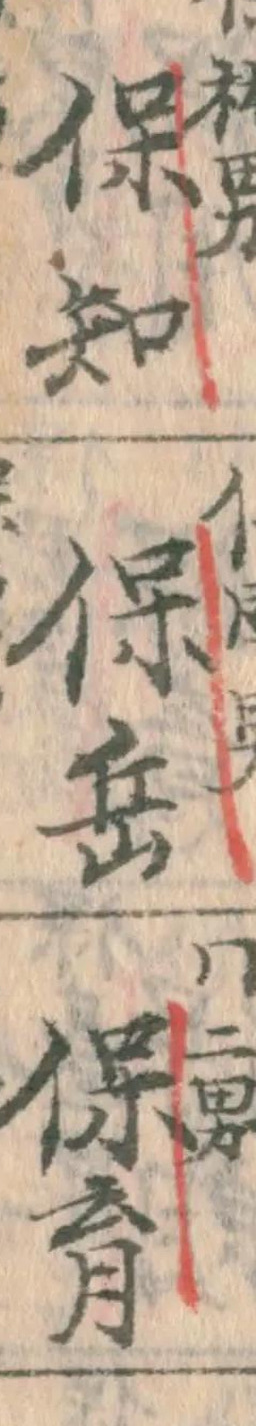保知保岳保育
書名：賀茂社記録. 第24冊
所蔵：国立国会図書館 National Diet Library, JAPAN
